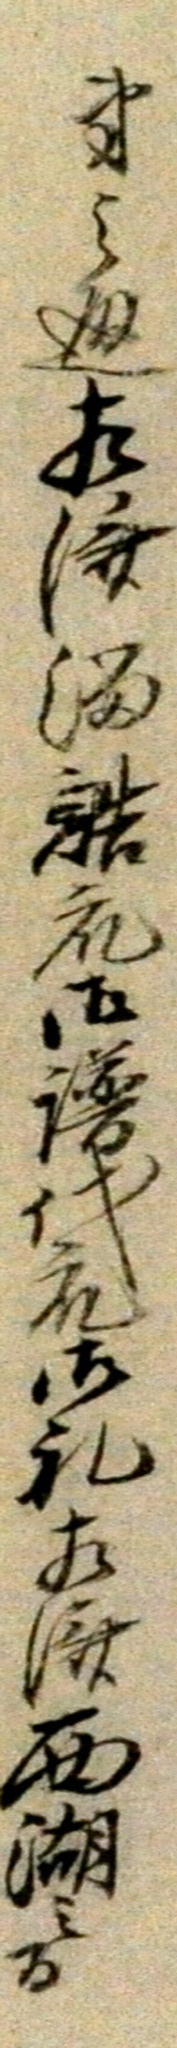第之通相済溜詰衆御譜代衆御礼相済西湖之間
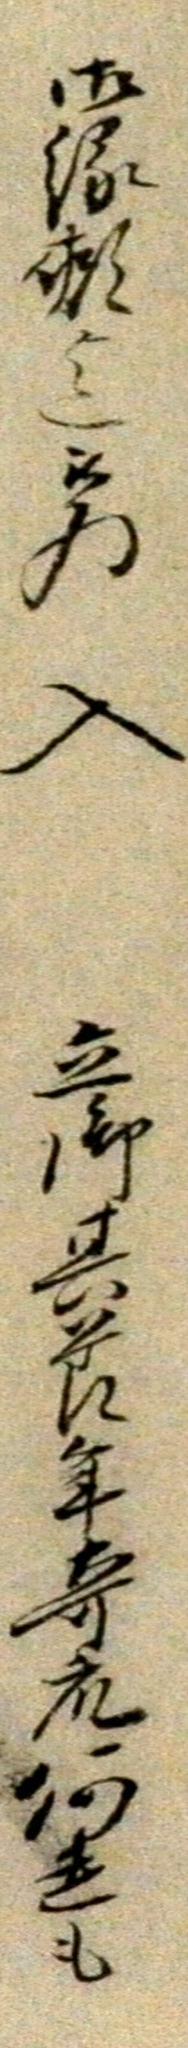御縁頬迄被為入立御其節年寄衆何れも
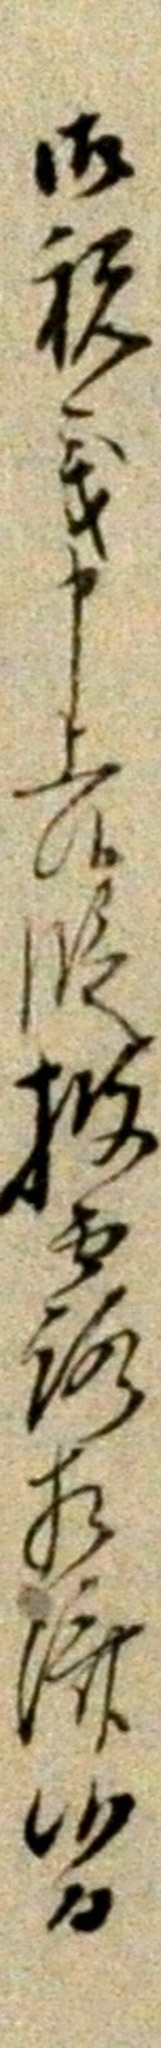御祝義申上候段披露相済候而
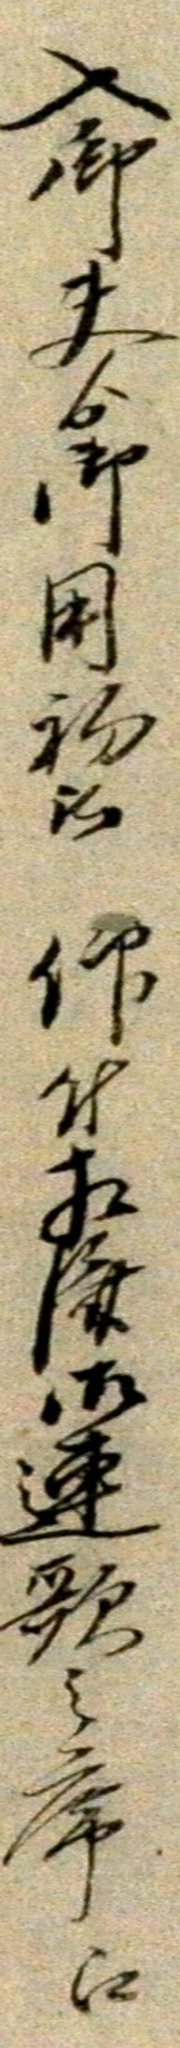入御夫ゟ御用初被仰付相済御連歌之席え
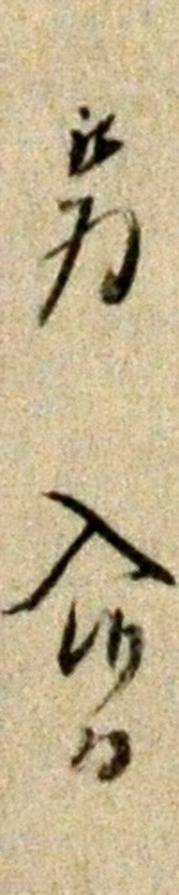被為入候而
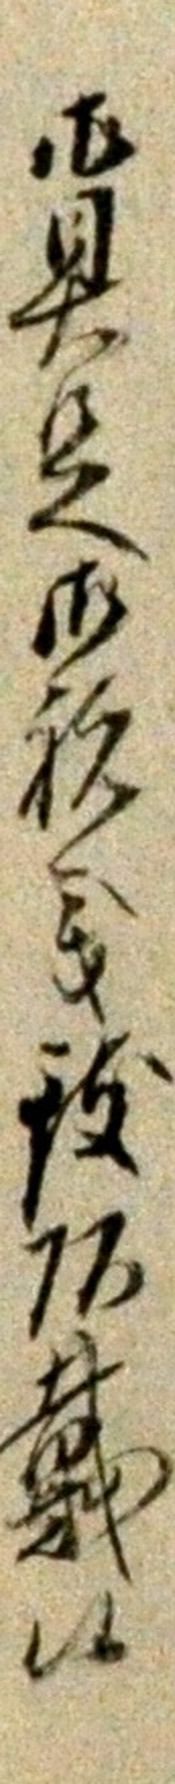御具足御祝義致頂戴候
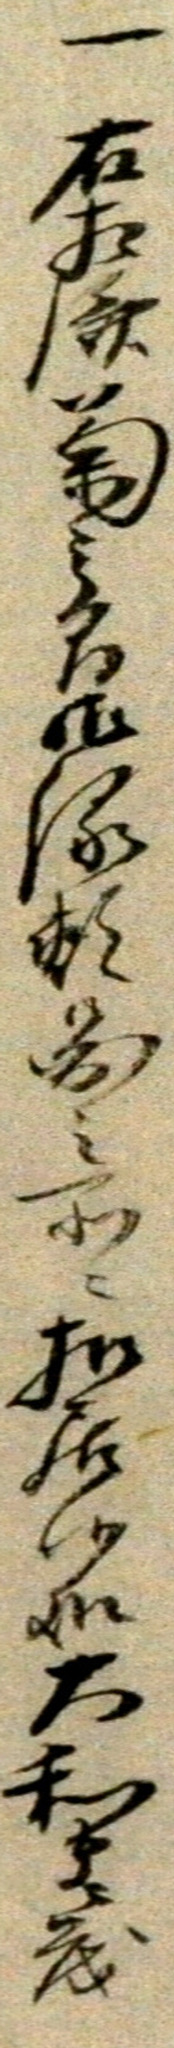一右相済菊之間御縁頬図之所ニ扣居候処大和守も
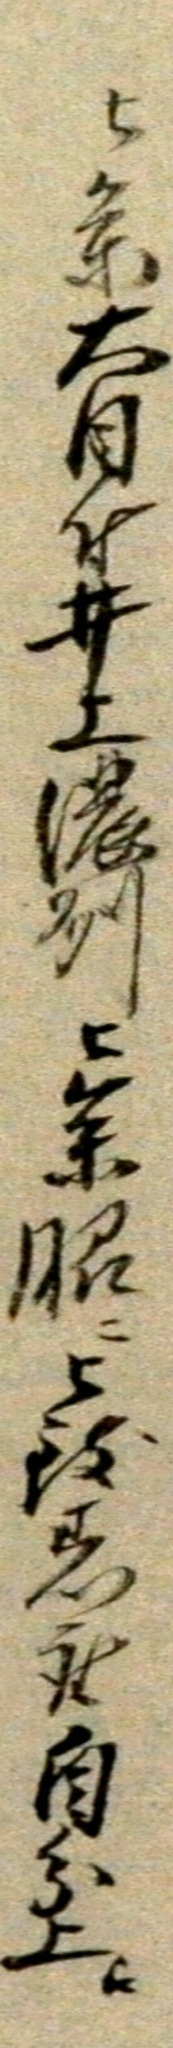被参大目付井上濃州被参脇ニ被致着座自分上え

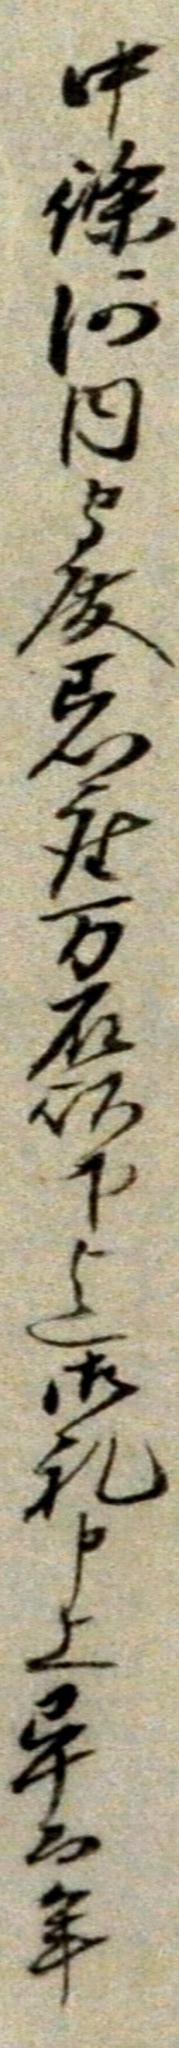中條河内守殿着座万石以下迄御礼申上畢而年
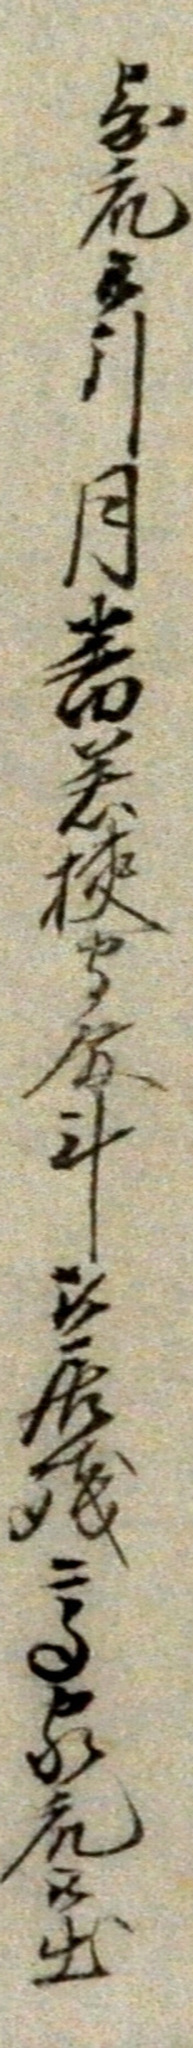寄衆被引月番若狭守殿計被居残高家衆被出
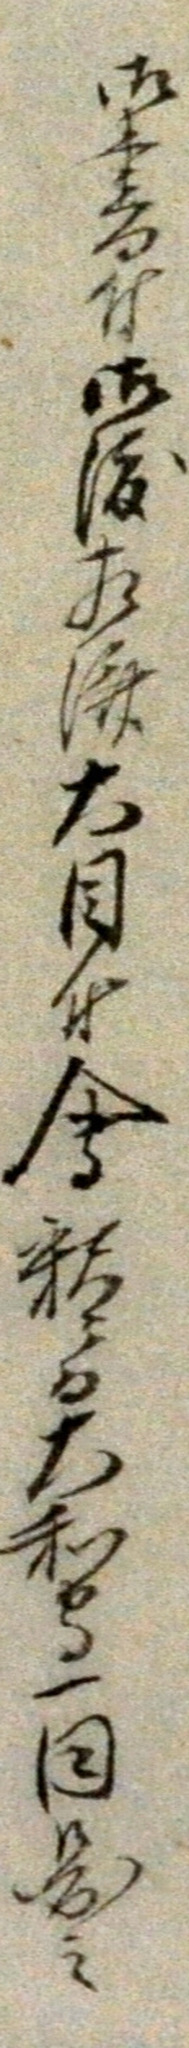御書付御渡相済大目付会釈ニ而大和守一同図之
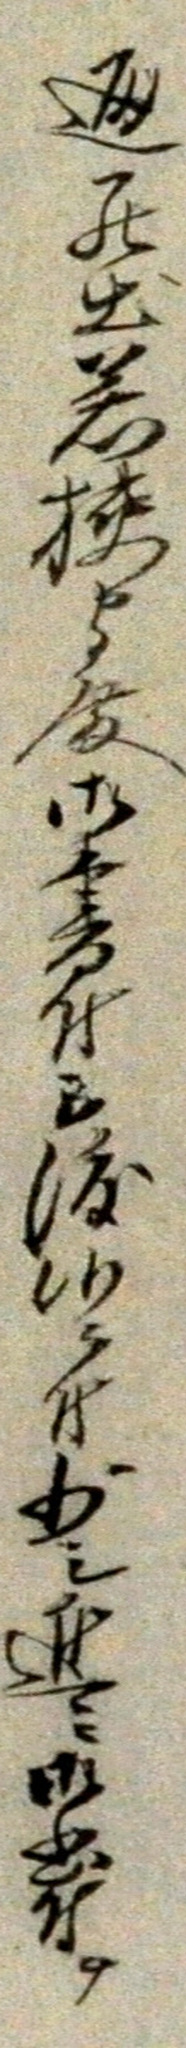通罷出若狭守殿御書付被渡候ニ付少シ進ミ御書付ヲ
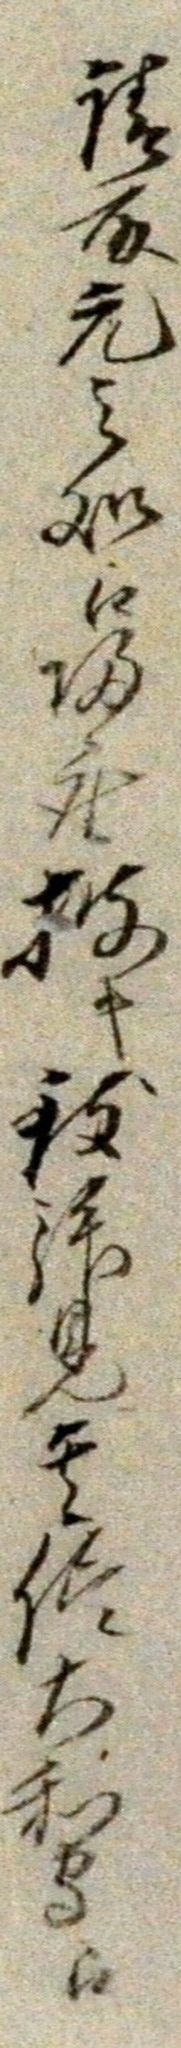請取元之処え帰座披キ致拝見其侭大和守え
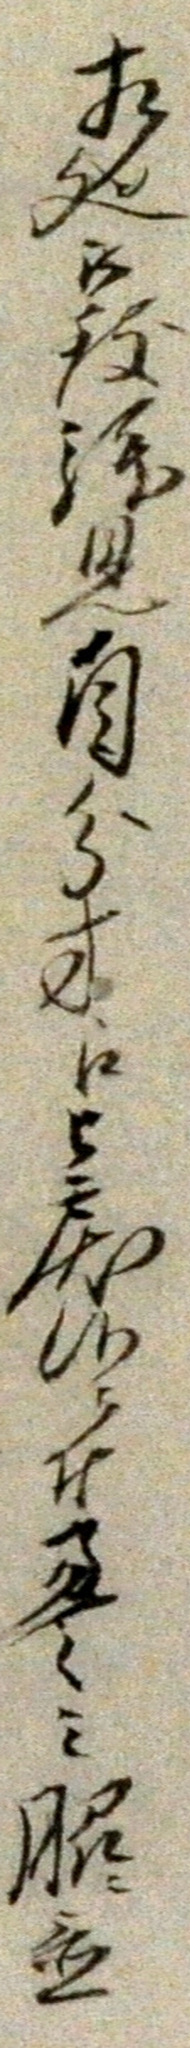相廻被致拝見自分方え被戻候ニ付畳之脇ニ置
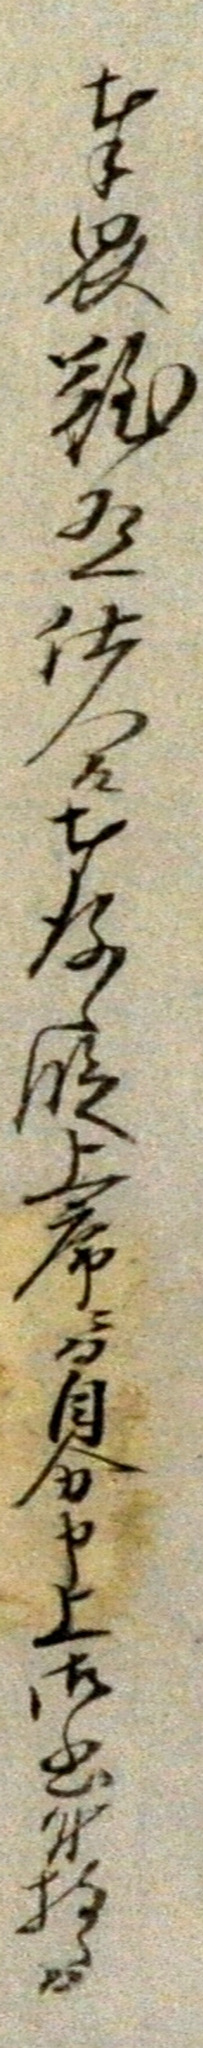奉畏難有仕合奉存候段上席ニ而自分申上御書付持候而
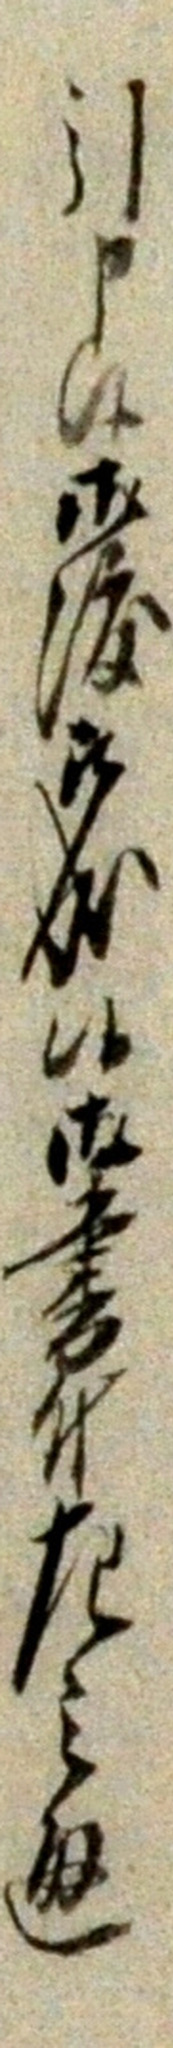引申候御渡被成候御書付左之通
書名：御鏡餅御用留（写）
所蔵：伊那市立高遠町図書館・合同会社AMANE
